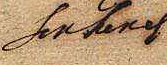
Senhores
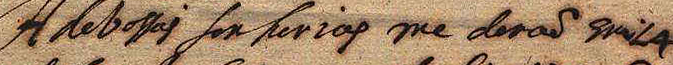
A de Vossas Senhorias me deraõ Em 14
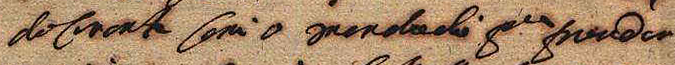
do Corente Com o mandado pa prender
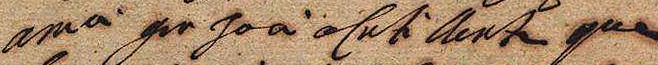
a ma gorJoa a Cutillente que
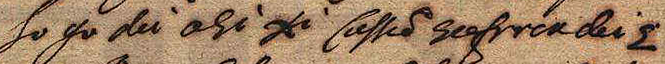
Logo dei a EixiCussaõ E a prendei E
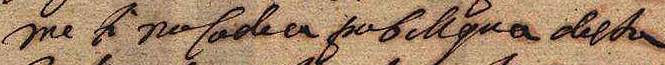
meti na Cadea pubellqua desta
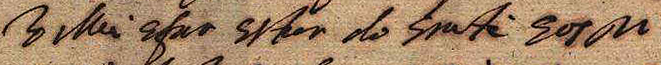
Villa E por Estar doEmte E os Ri
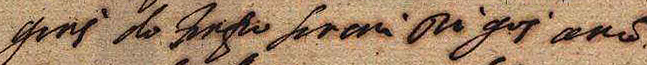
gors do tenpo serem Rigos a naõ
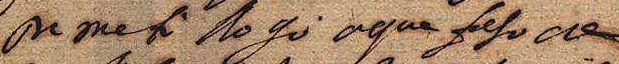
Remeti llogo o que faso oie
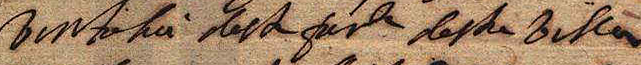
vinte hū deste parte desta Villa
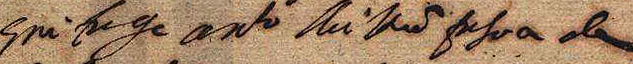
Emtrege anto lleittaõ pesoa de
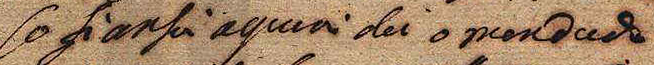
Cofiansa a quen dei o mandado
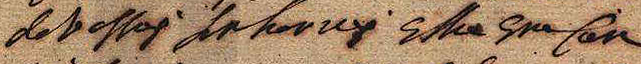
de vossas Senhorias E lhe EmCar
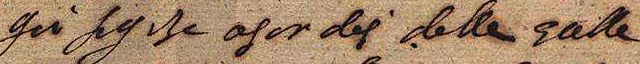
gei segize as ordes delle E a lle
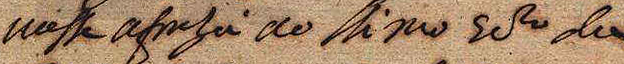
uasse a prizā do llimoEiro da
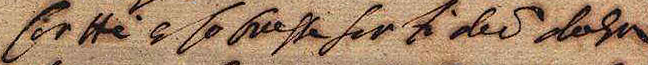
Cortte E Cobrasse sertidaõ da En
